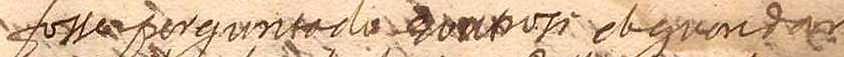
fosse perguntado E outrosi de guardar
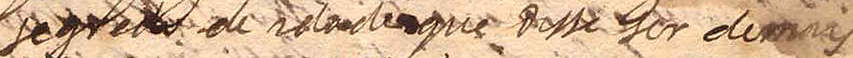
segredo de idade que disse ser de mais
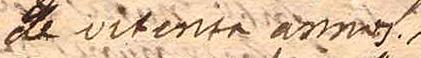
de oitenta annos./
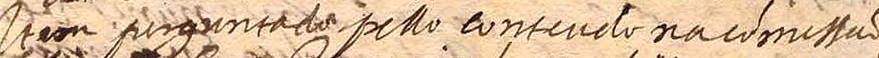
Item perguntado pello conteudo na cōmissaõ
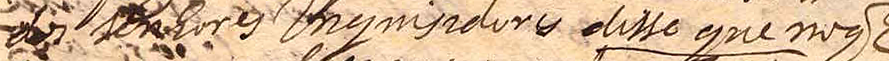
dos senhores Inquisidores disse que no q̄
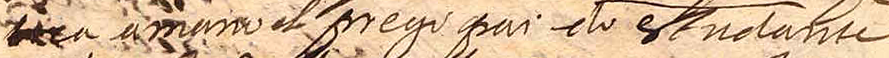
toca a manoel prego pai do estudante
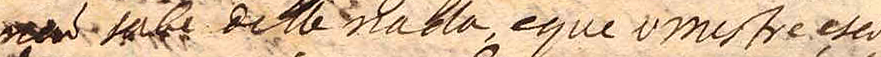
naõ sabe delle nada, e que o mestre esco
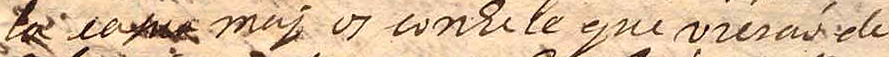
la e a sua maj os conhece que vieraõ de
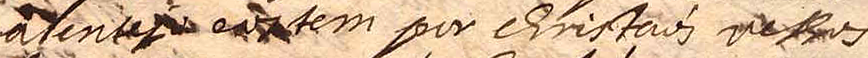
alentejo e os tem por christaõs velhos
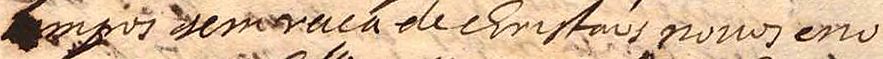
limpos e sem raça de christaõs nouos e no
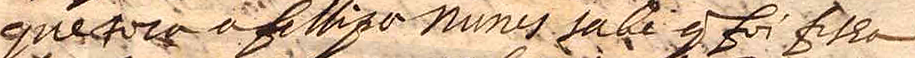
que toca a fellipa nunes sabe q̄ foi filha
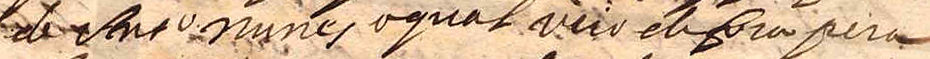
de Anto nunes o qual veio de fora pera
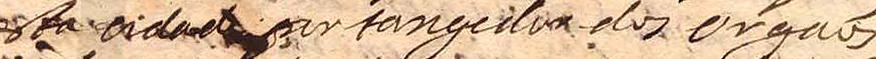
esta cidade por tangedor dos orgaõs
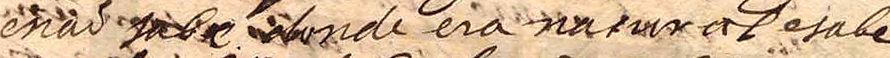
e naõ sabe donde era natural e sabe
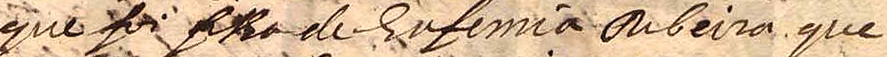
que foi filho de Eufemia Ribeira que
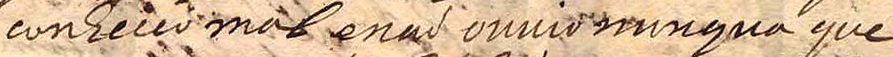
conheceo mal e naõ ouuio nunqua que
